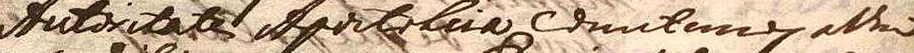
Autoritate Apostolica cometemos a Vm
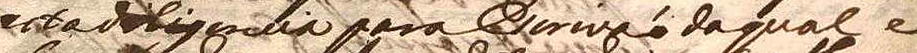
esta diligencia para Escrivaõ da qual e
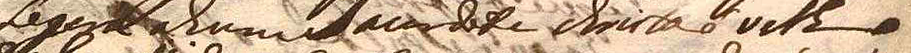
Legera a hum sacerdote christaõ velho
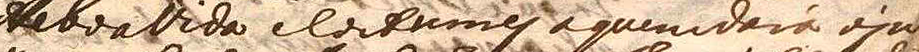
de boa Vida e costumes a quem dará o ju
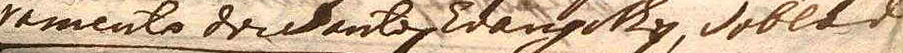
ramento dos Santos Evangelhos, sob car
